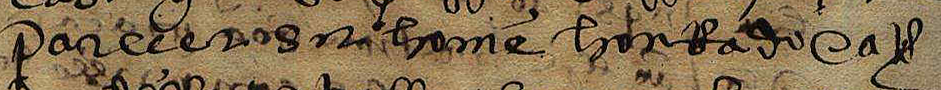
parecer ser homē honRado e aꝞ
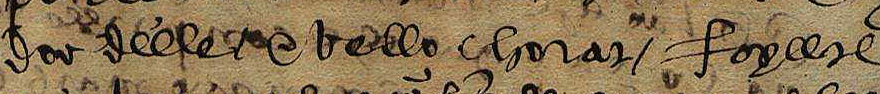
dor delle / e vello chorar / foylhe
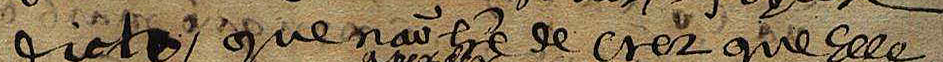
dicto / que naõ he de crer que Elle
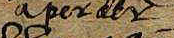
a perder
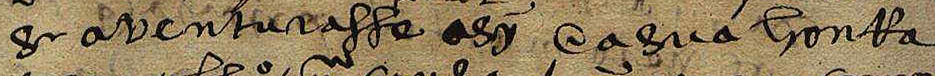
se aventurasse asȳ e a sua honRa
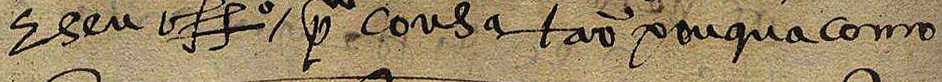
E seu offo / p̄o cousa taõ pouqua como
